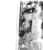○（夏）
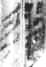○（夕）
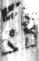○（建）
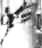於
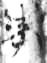未
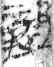○（陷）
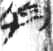於
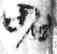申
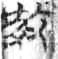○（破）
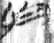於
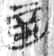梄（酉）
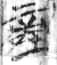坪（平）
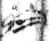於
